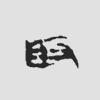取
